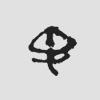思
